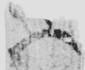之
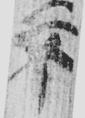不
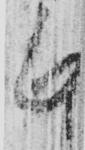㠯（以）
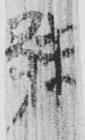邦
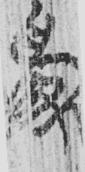○（家）
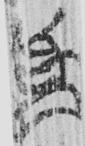爲
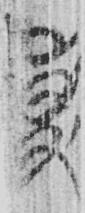事
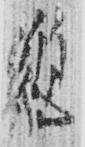縱
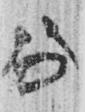公
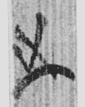之
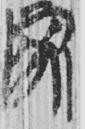所
